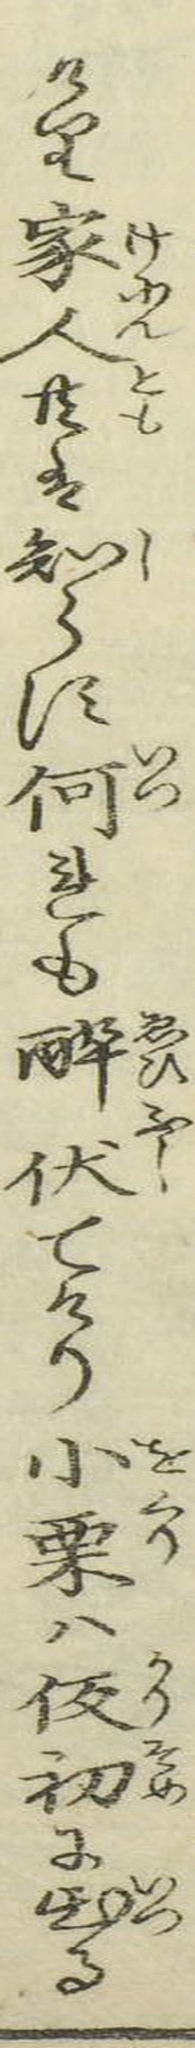けり家人共は知らす何れも酔伏てけり小栗は仮初に出る
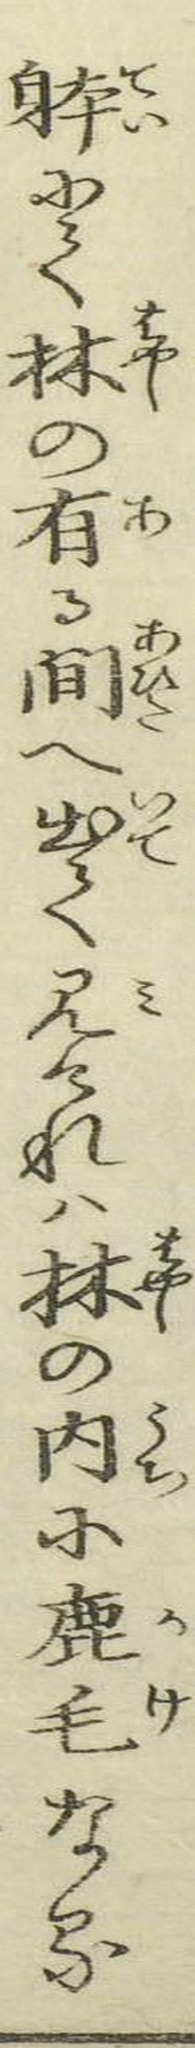躰にて林の有る間へ出て見けれは林の内に鹿毛なる
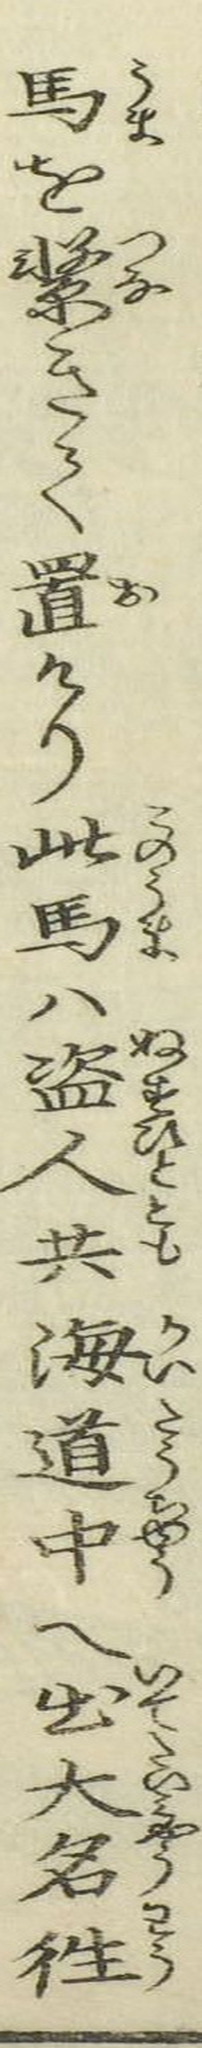馬を繋きて置けり此馬は盗人共海道中へ出大名往
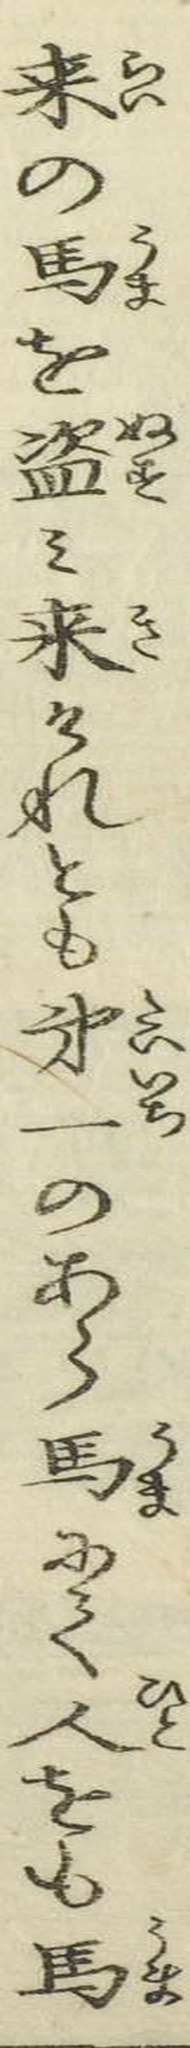来の馬を盗み来けれとも㐧一のあら馬にて人をも馬
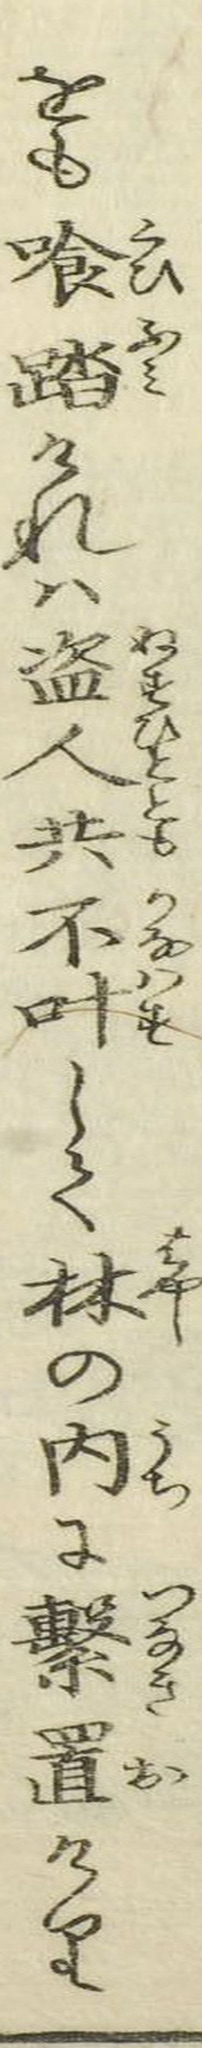をも喰踏けれは盗人共不叶して林の内に繋置けり
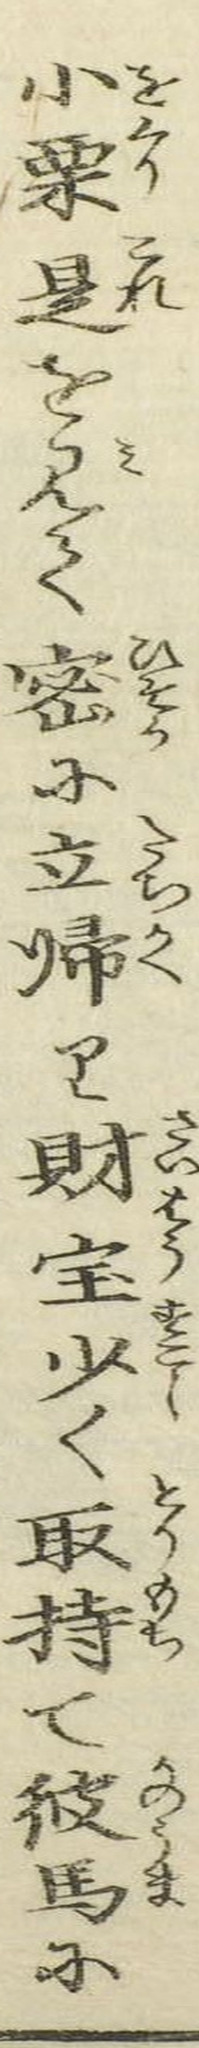小栗是を見て密に立帰り財宝少く取持て彼馬に
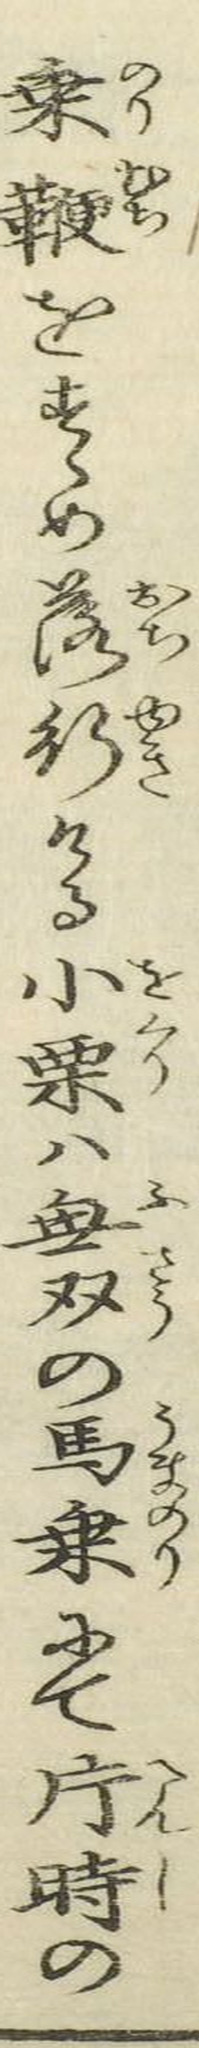乗鞭をすゝめ落行ける小栗は無双の馬乗にて片時の
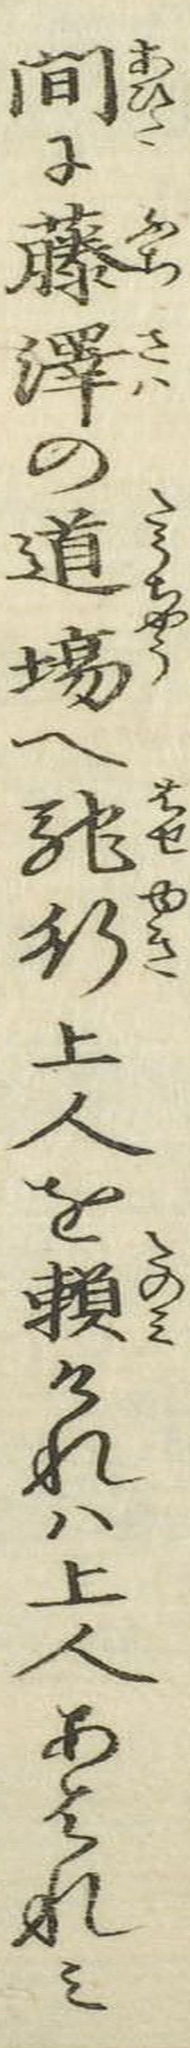間に藤澤の道塲へ馳行上人を頼けれは上人あはれみ
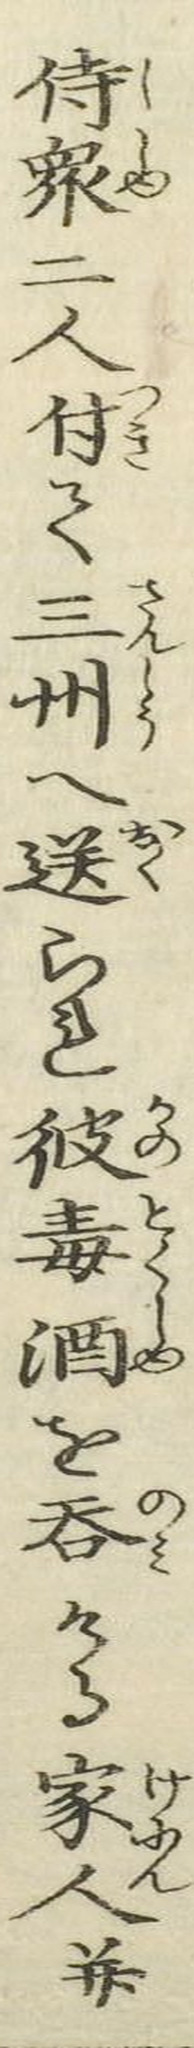侍衆二人付て三州へ送られ彼毒酒を吞ける家人幷
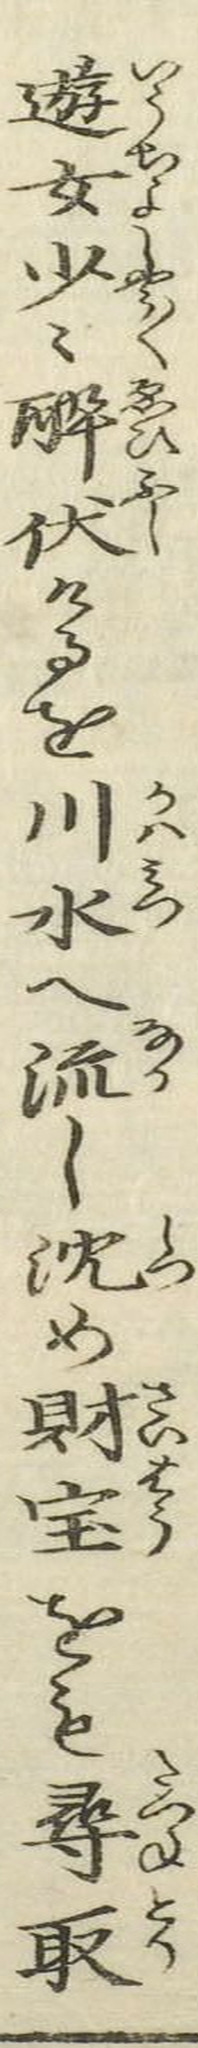遊女少々酔伏けるを川水へ流し沈め財宝をも尋取
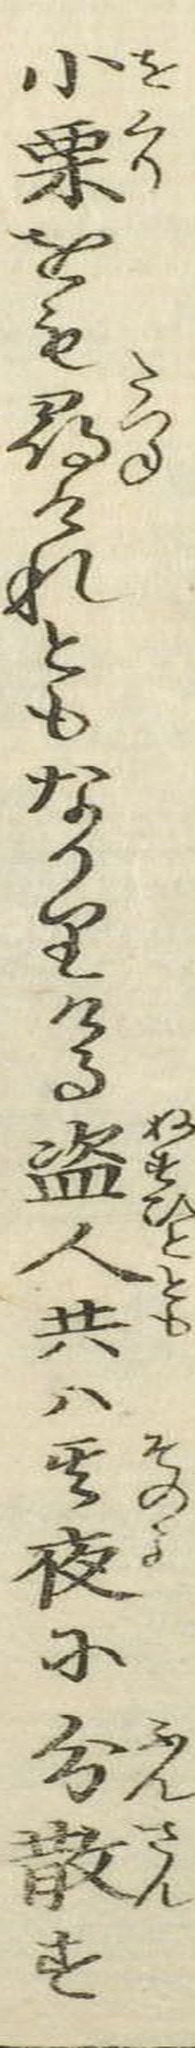小栗をも尋けれともなかりける盗人共は其夜に分散す
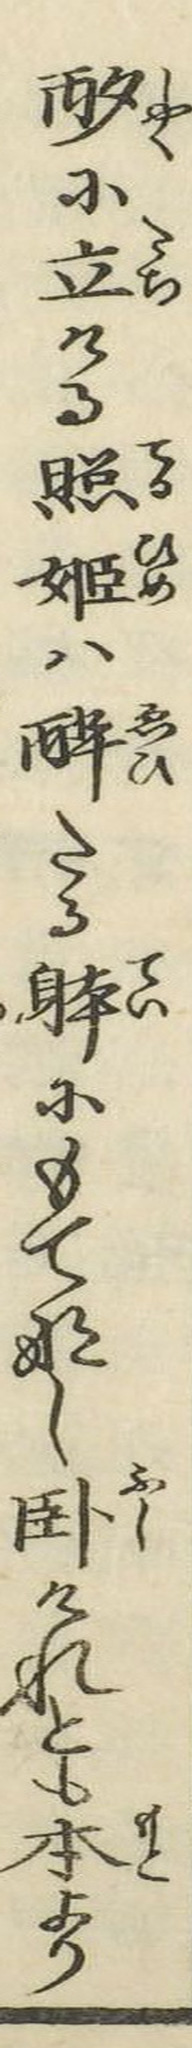酌に立ける照姫は酔たる躰にもてなし卧けれとも本より
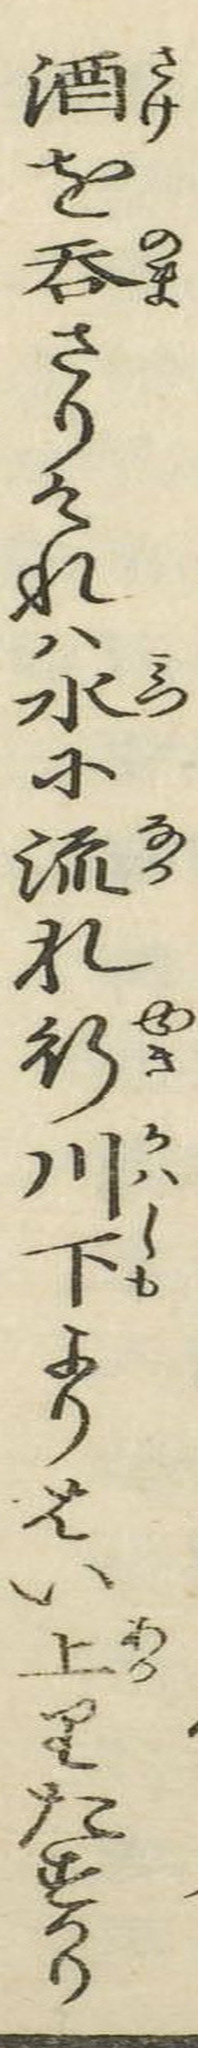酒を吞さりけれは水に流れ行川下よりはい上りたすかり
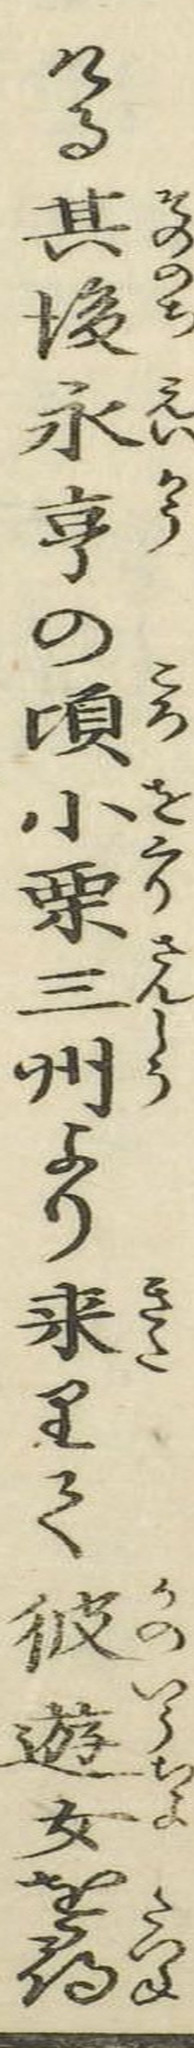ける其後永亨の頃小栗三州より来りて彼遊女を尋
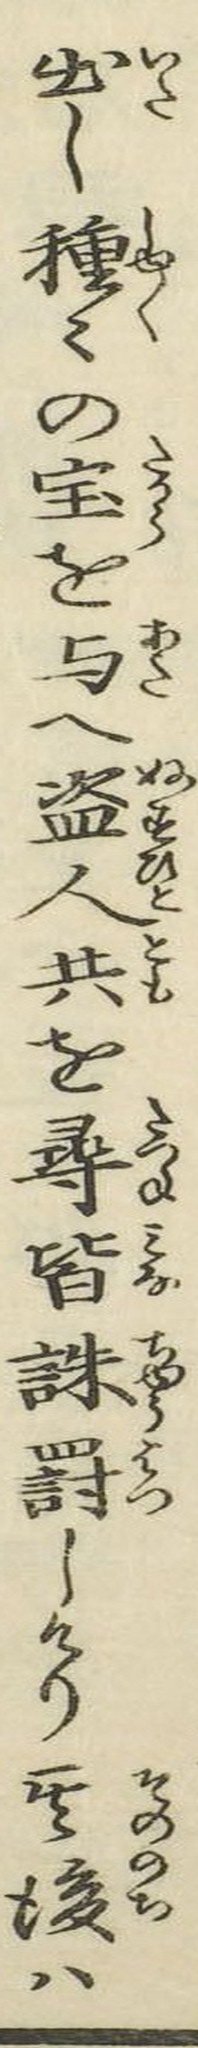出し種々の宝を与へ盗人共を尋皆誅罰しけり其後は
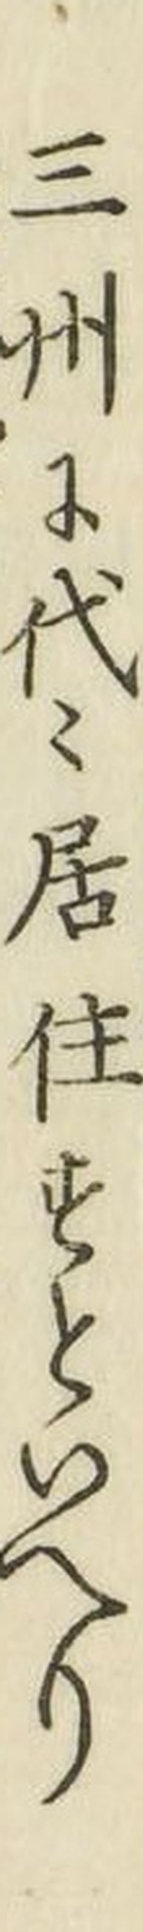三州に代々居住すといへり
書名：江戸名所図会 20巻 巻之6
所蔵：東京学芸大学教育コンテンツアーカイブ
